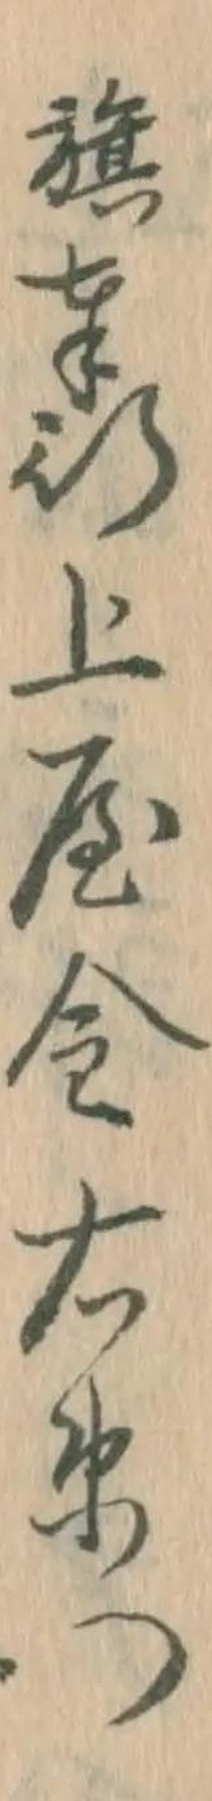旗奉行上屋金右衛門
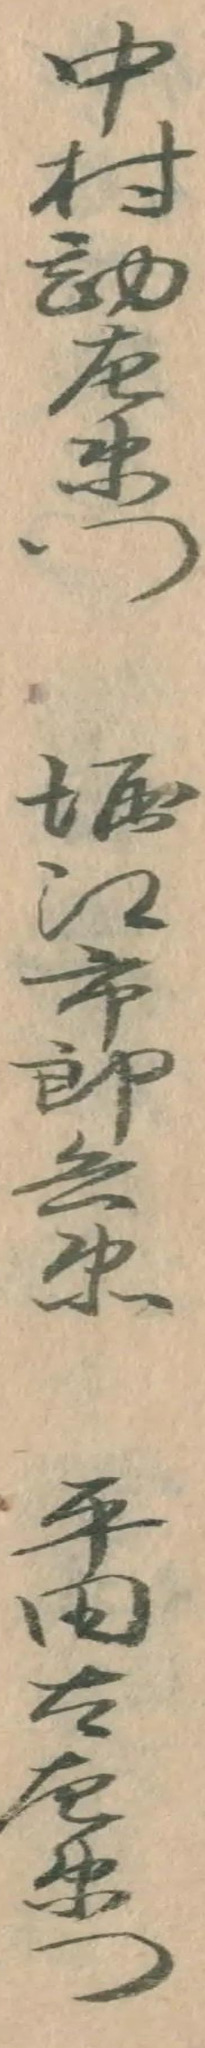中村勘左衛門堀江市郎兵衛平田太左衛門

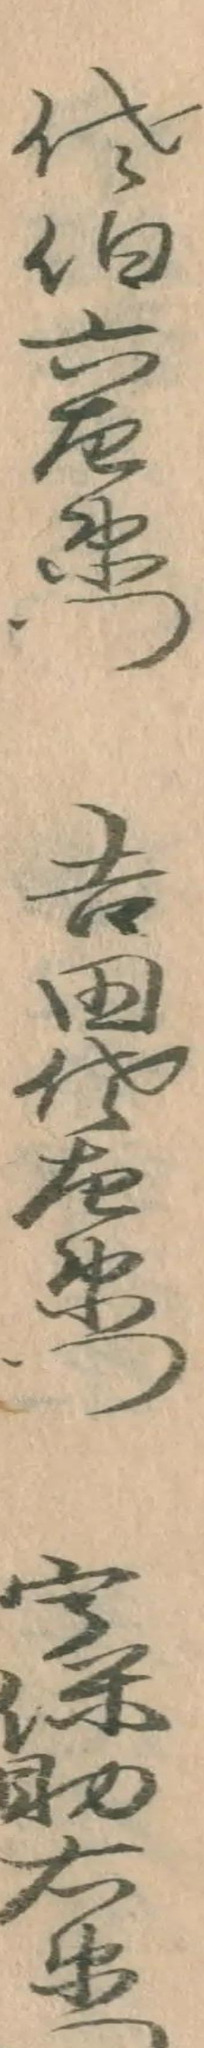佐伯六左衛門吉田佐左衛門宇保助右衛門
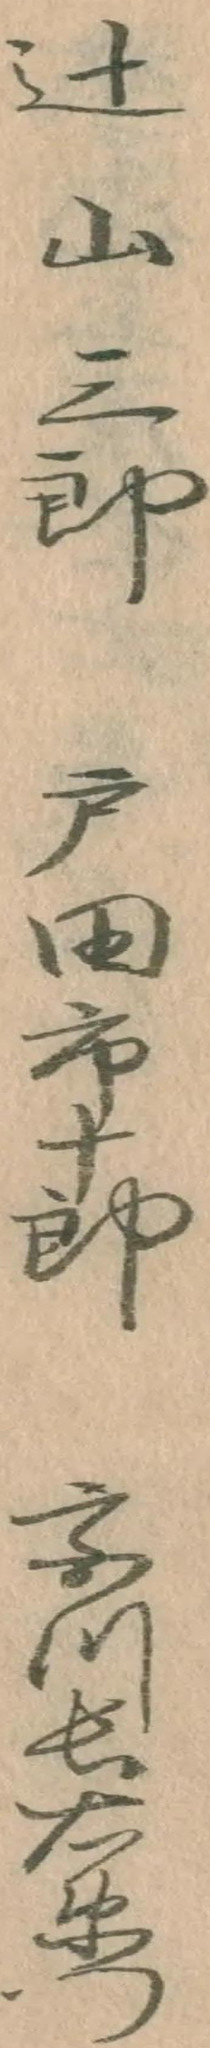辻山三郎戸田市十郎宮川長右衛門
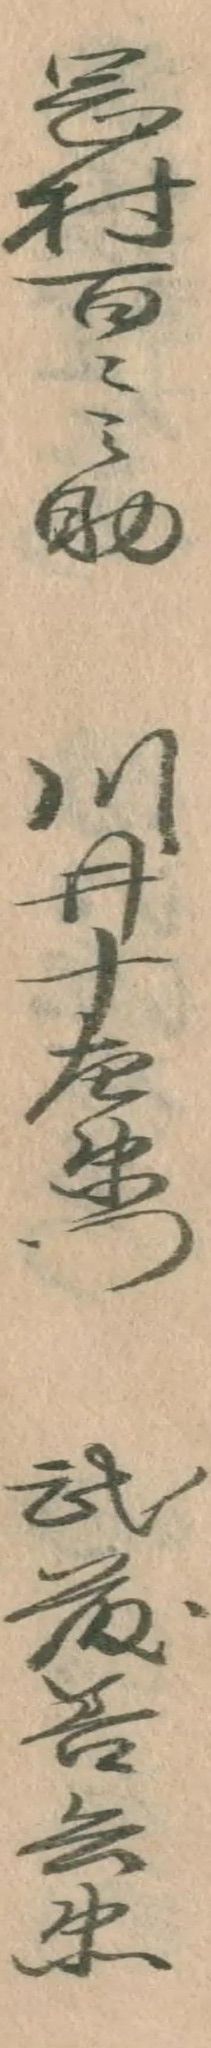岡村百々之助川井十左衛門武藤善兵衛
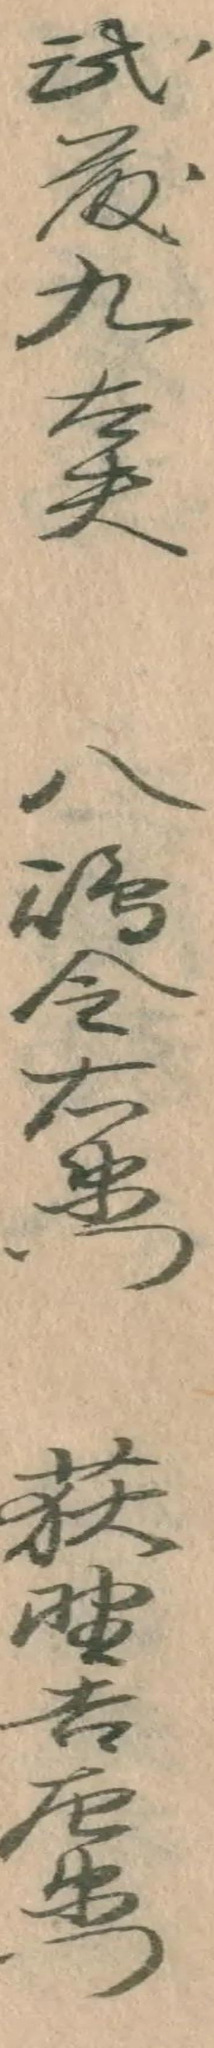武藤九太夫八島金右衛門萩野吉左衛門
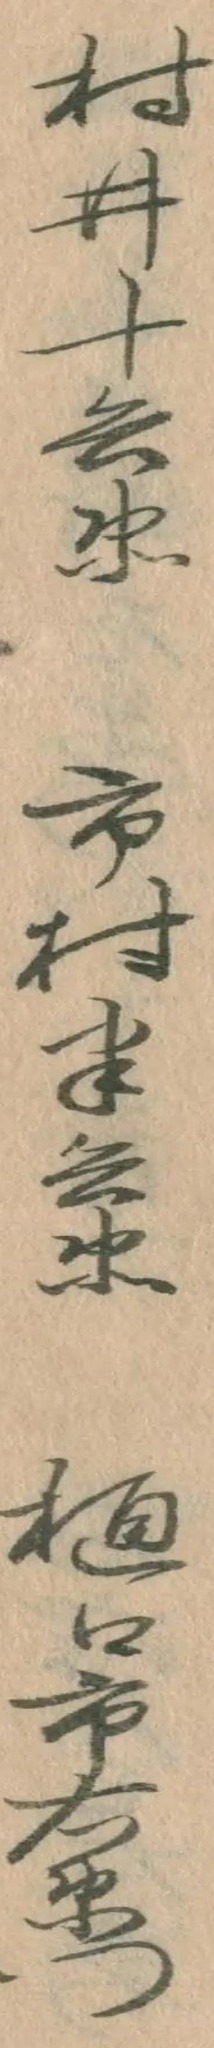村井十兵衛市村半兵衛樋口市右衛門
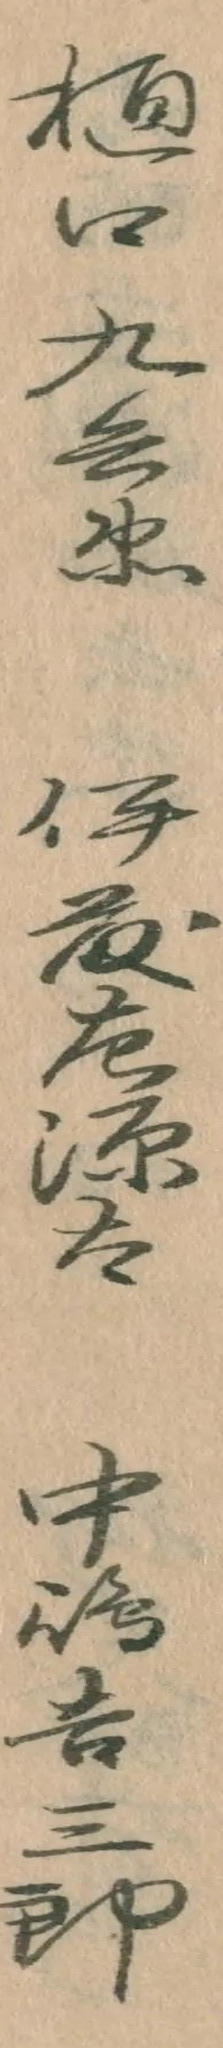樋口九兵衛伊藤左源太中島吉三郎
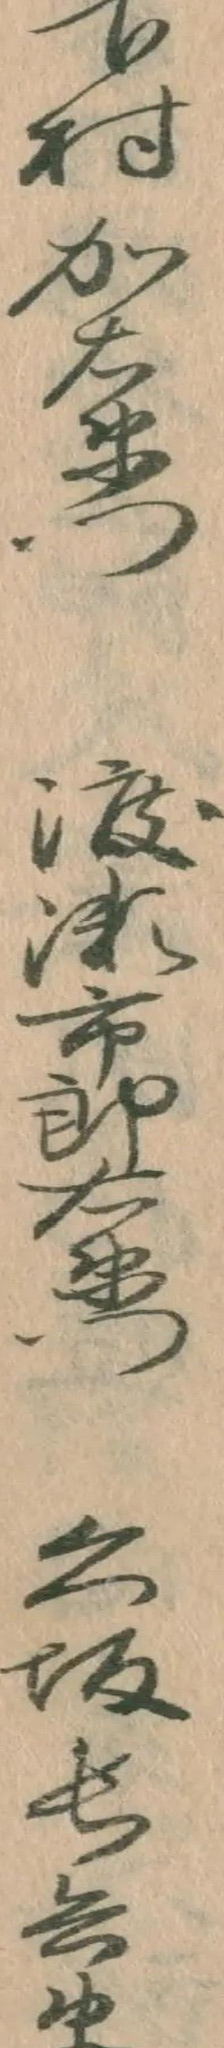下村加右衛門渡瀬市郎右衛門久坂長兵衛
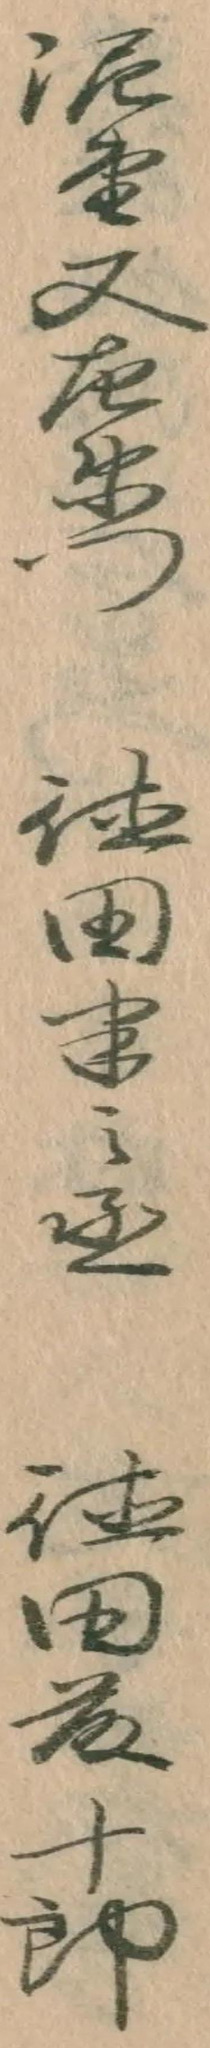泥堂又左衛門徳田半之丞徳田藤十郎
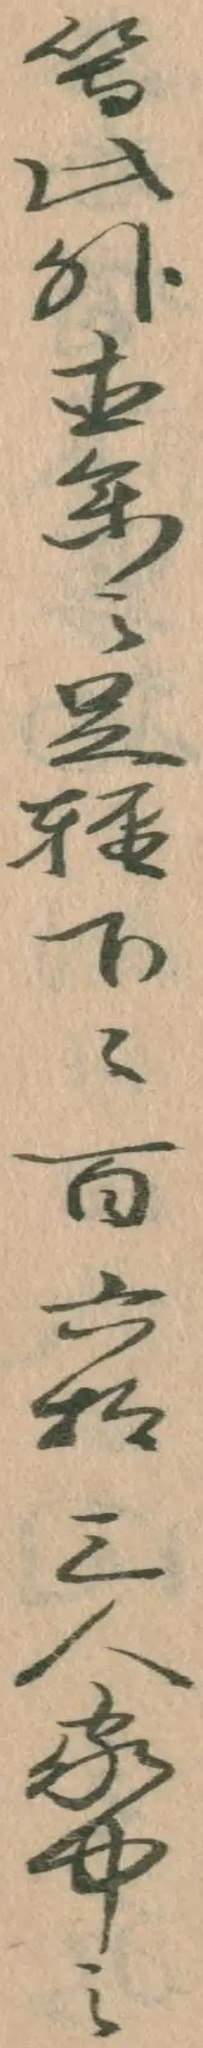等此外直参之足軽下々百六拾三人家中之
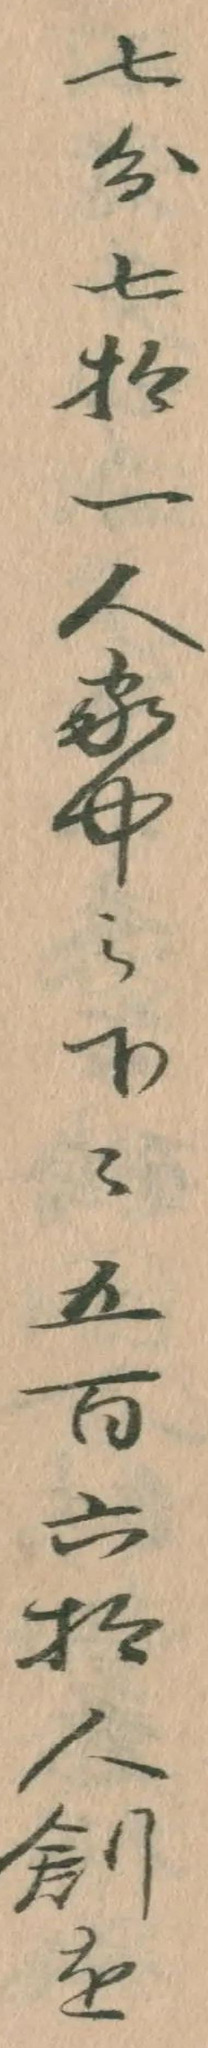七分七拾一人家中之下々五百六拾人創を
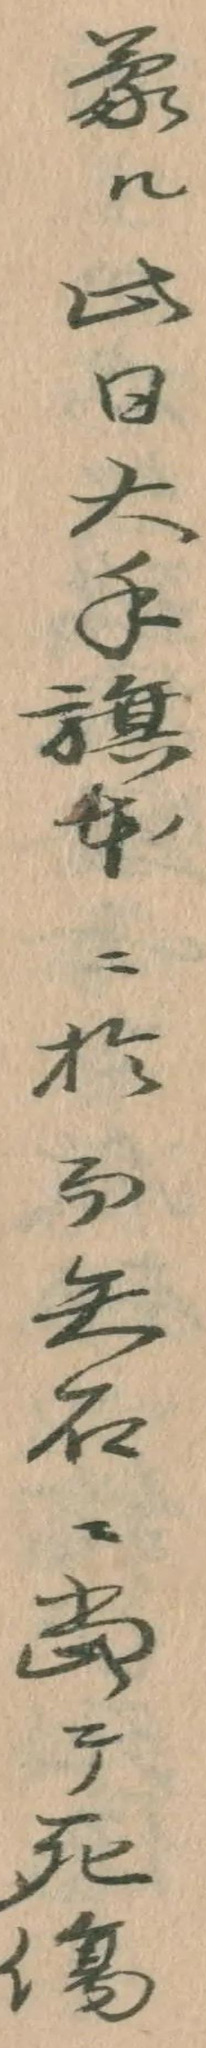承る此日大手旗本に於而矢石に当て死傷
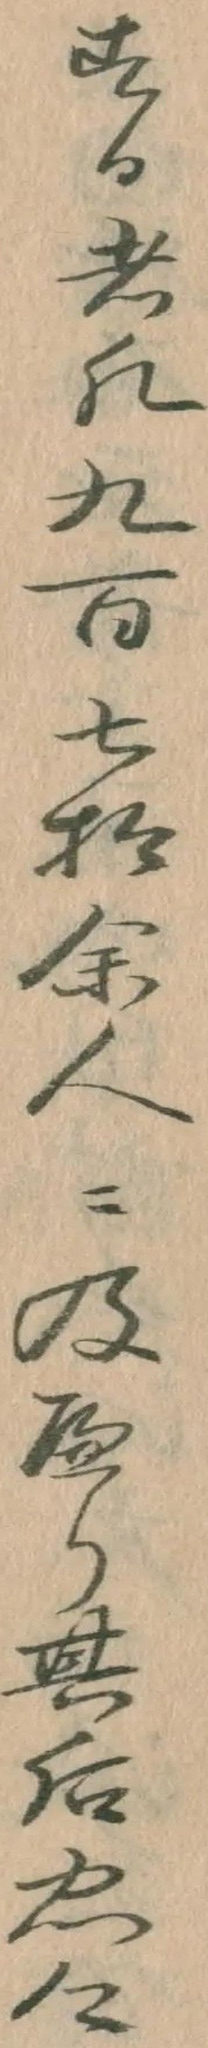春る者凡九百七拾余人に及扁り其后忠郷
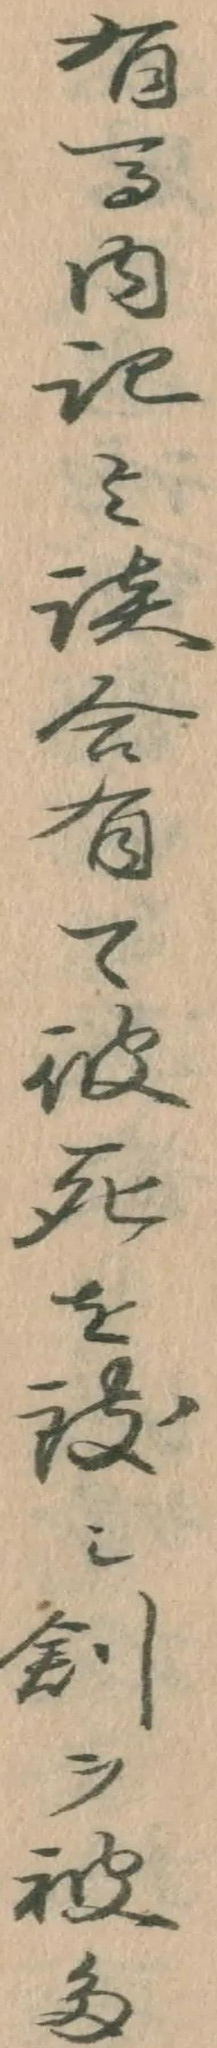有馬内記与談合有て彼死を致し創を被多
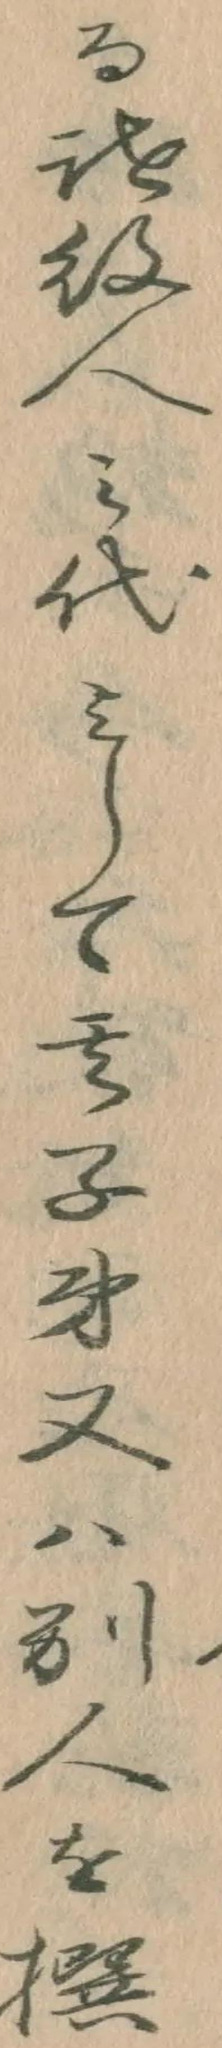る諸役人之代与して其子弟又は別人を撰
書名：切支丹御退治記 49巻. [5]
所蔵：国立国会図書館 National Diet Library, JAPAN
